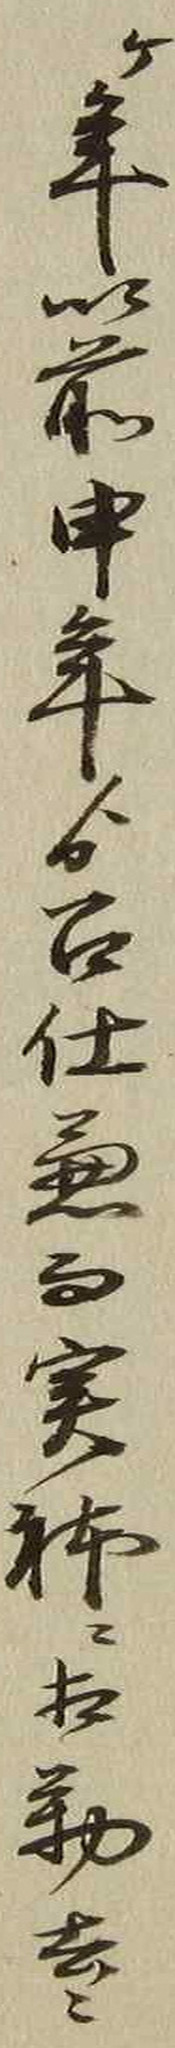年ケ以前申年ゟ召仕兼而実体に相勤去々
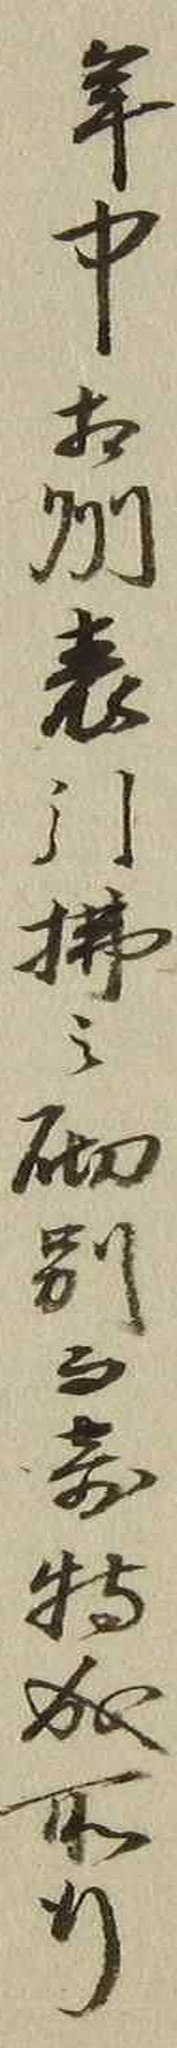年中相州表引払之砌別而奇特成所行
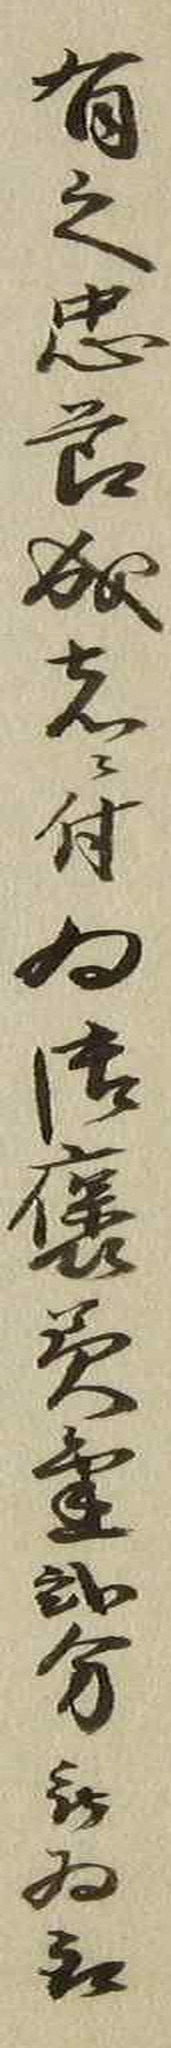有之忠節成者に付為御褒美金弐分被為取
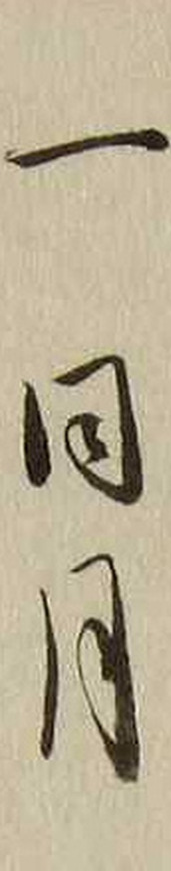一同月
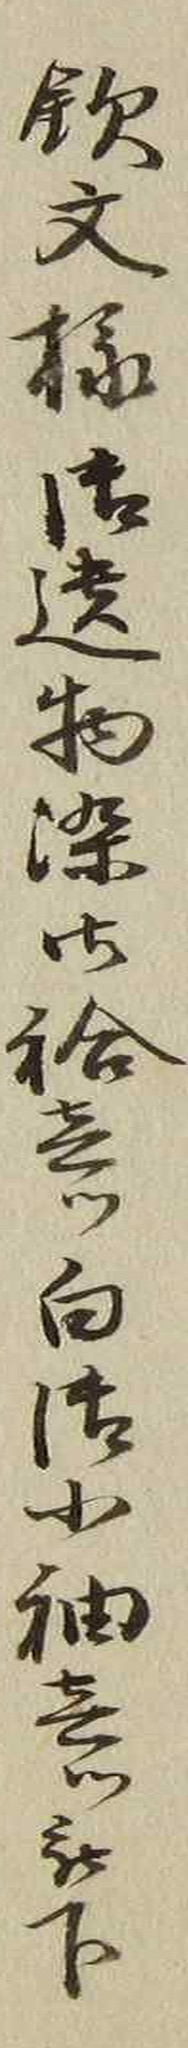欽文様御遺物染御袷壱つ白御小袖壱つ被下
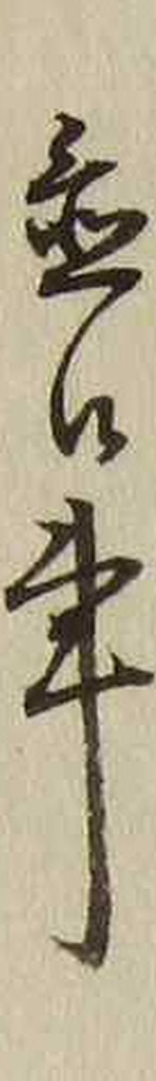置候事
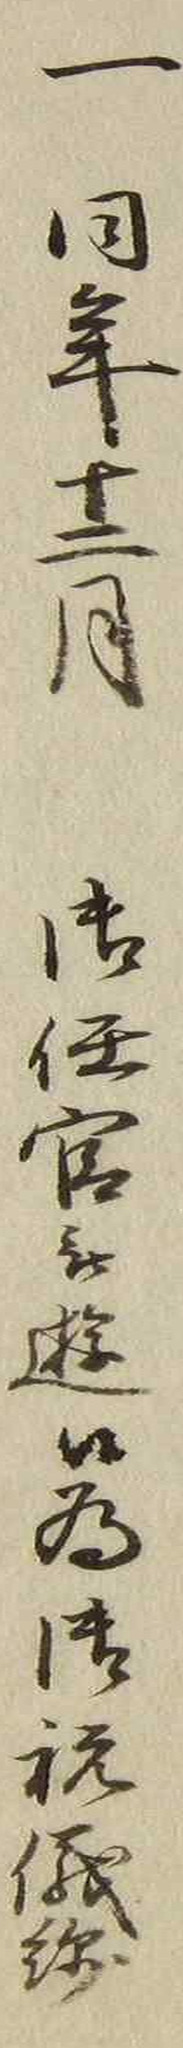一同年十二月御任官被遊候為御祝儀綿
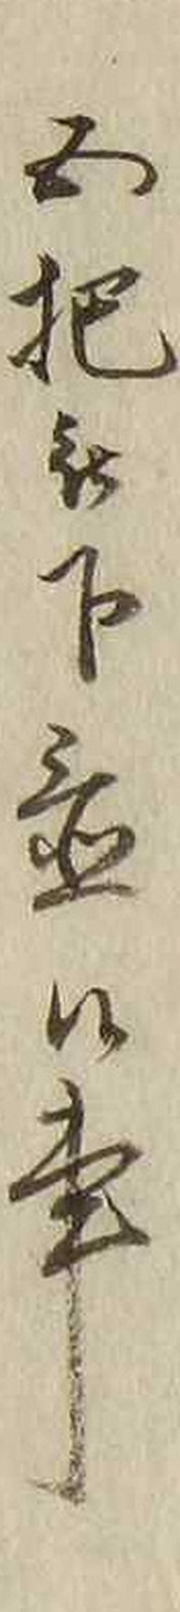五把被下置候事
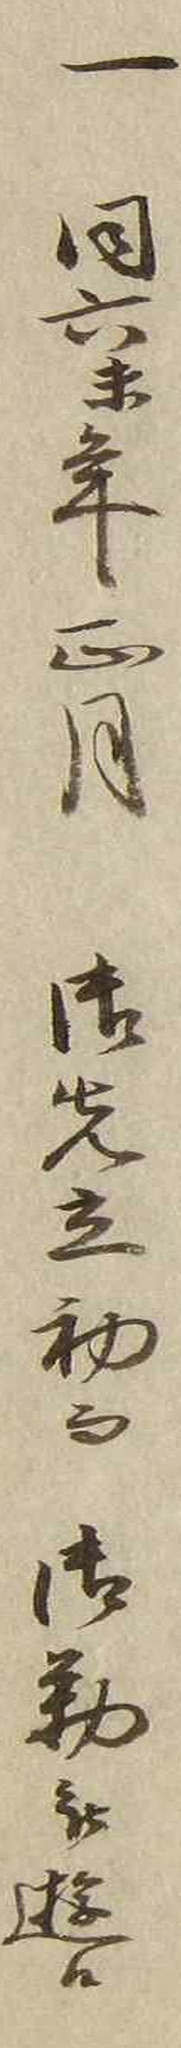一同六未年正月御先立初而御勤被遊候

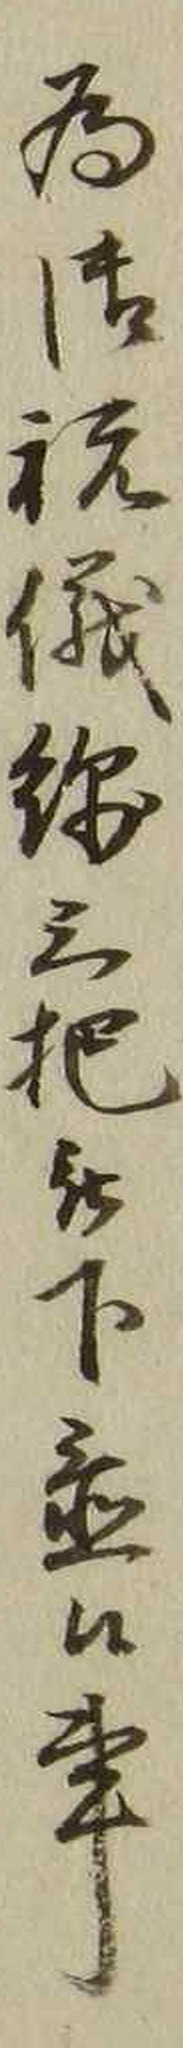為御祝儀綿三把被下置候事
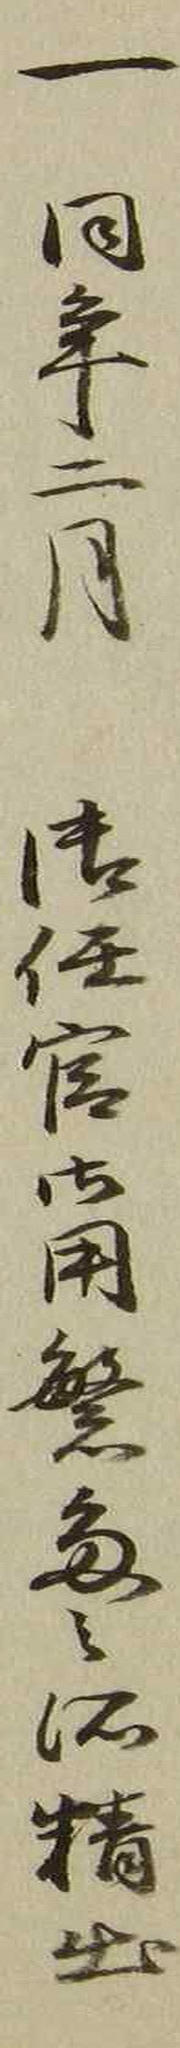一同年二月御任官御用繁多之所精出
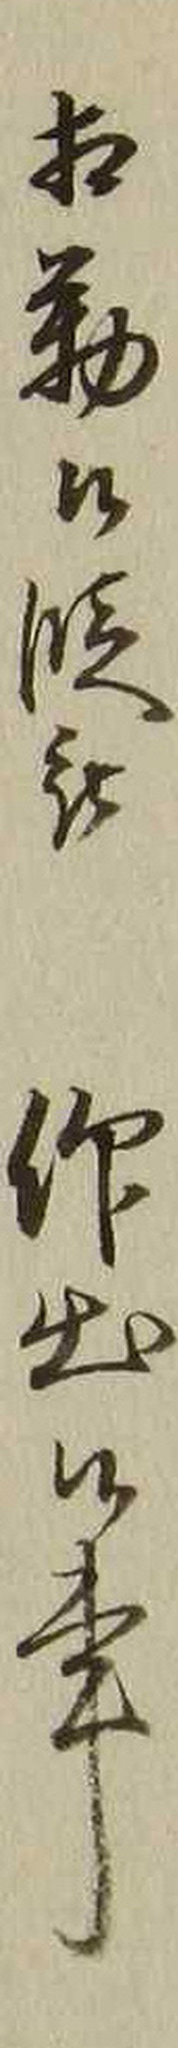相勤候段被仰出候事
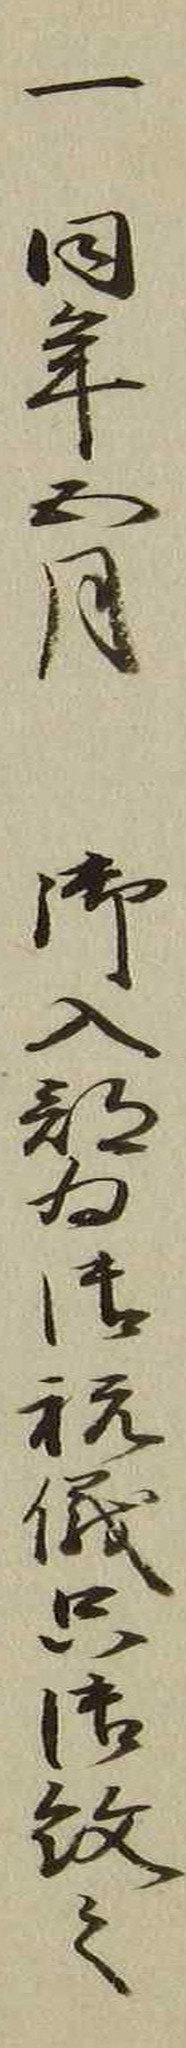一同年五月御入部為御祝儀只御紋之
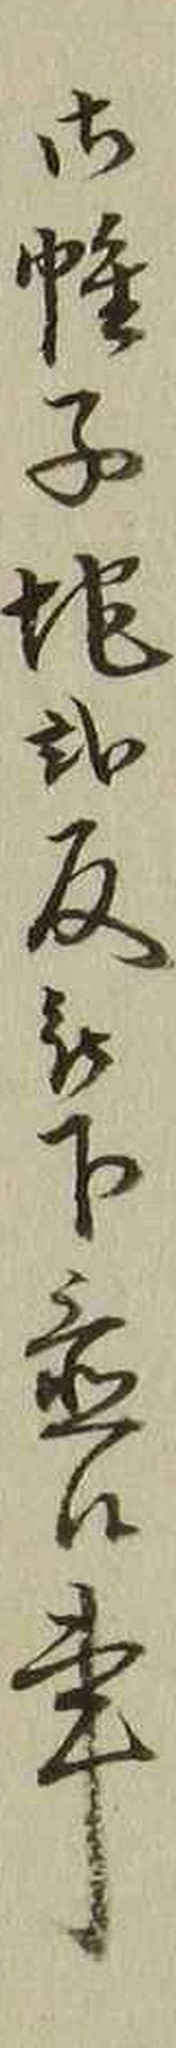御帷子地弐反被下置候事
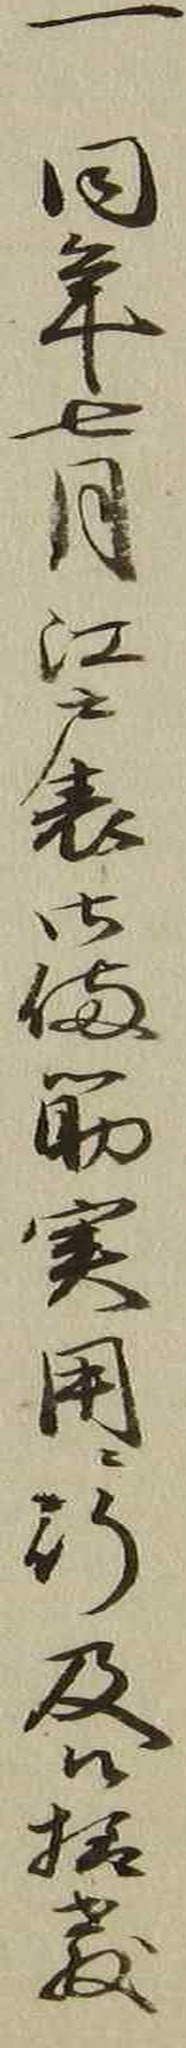一同年七月江戸表御備筋実用に行及候様教
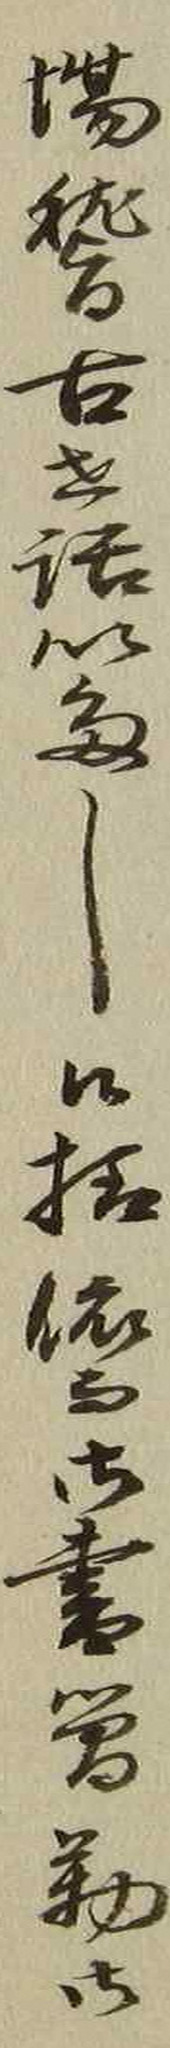場稽古世話いたし候様依而御書簡勤御
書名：諸士系譜　巻之133　た之部9
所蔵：会津若松市立会津図書館
